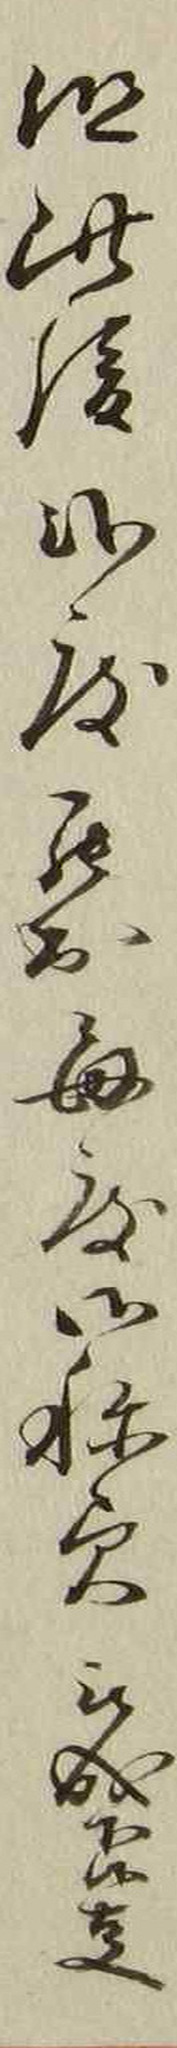但此後弐度罷出毎度御称美被成下候事
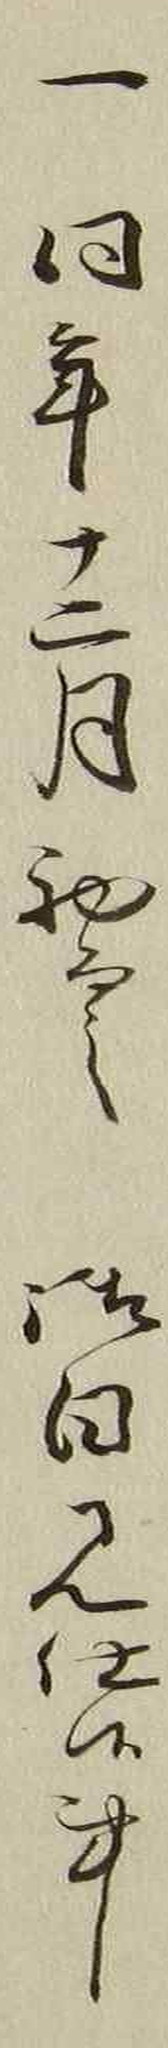一同年十二月初而之御目見仕候事
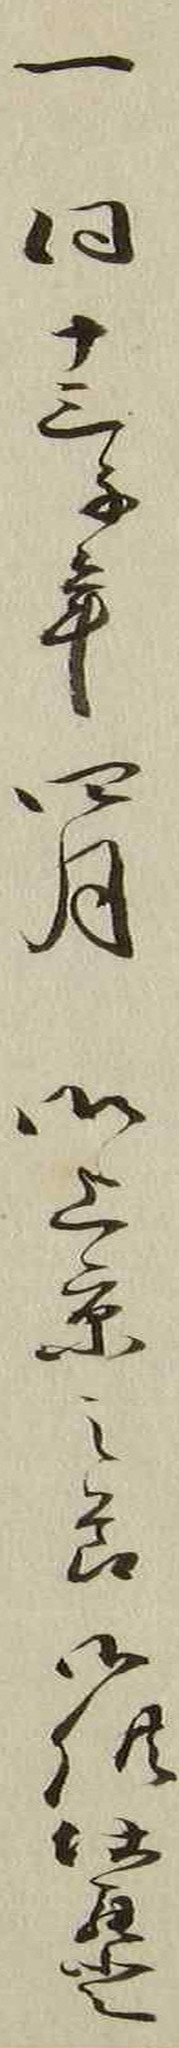一同十三子年四月御上京之節御供仕罷登
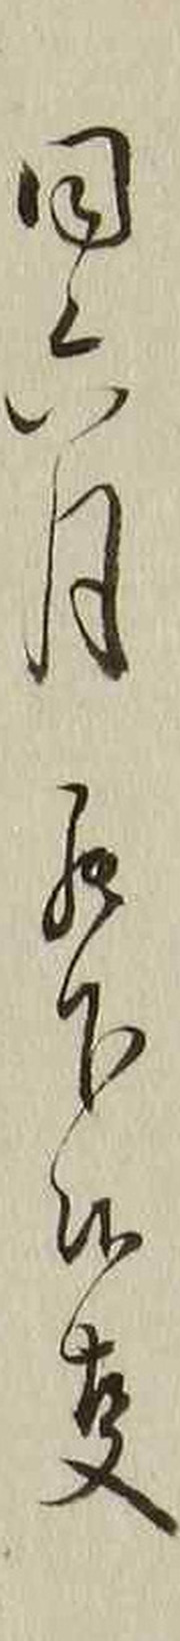同六月罷下候事
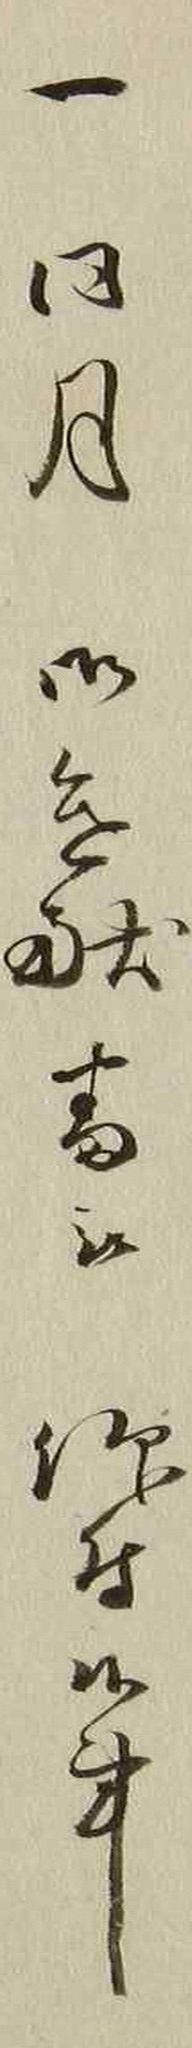一同月御進献番被仰付候事
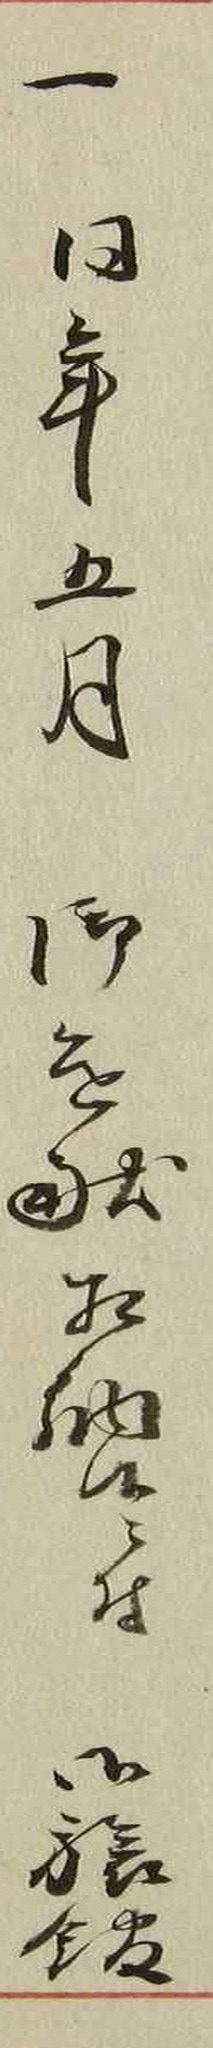一同年五月御進献相納候ニ付御旅館
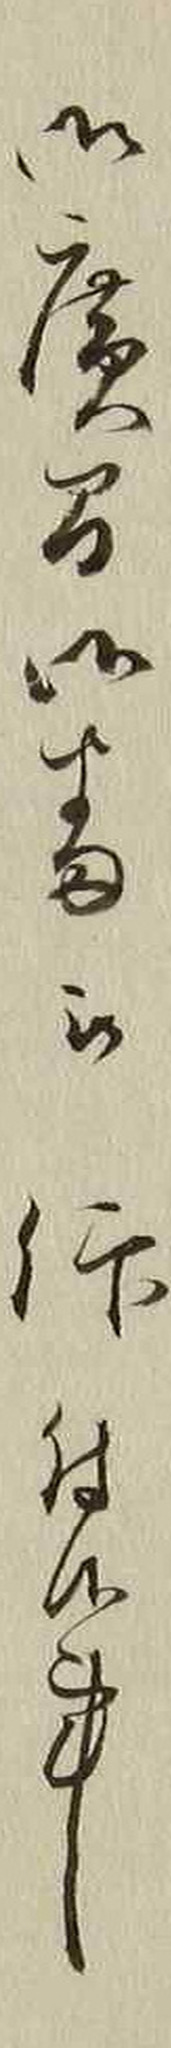御広間御番被仰付候事
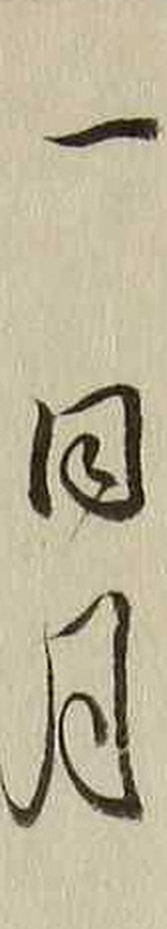一同月
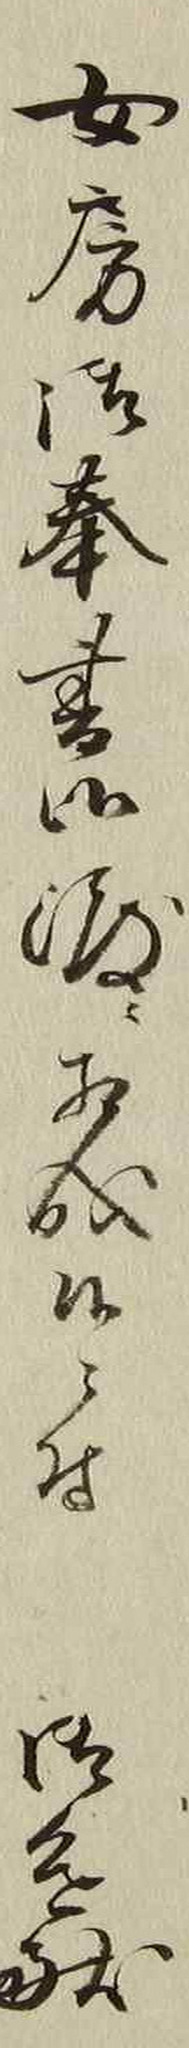女房御奉書御渡ニ相成候ニ付御進献
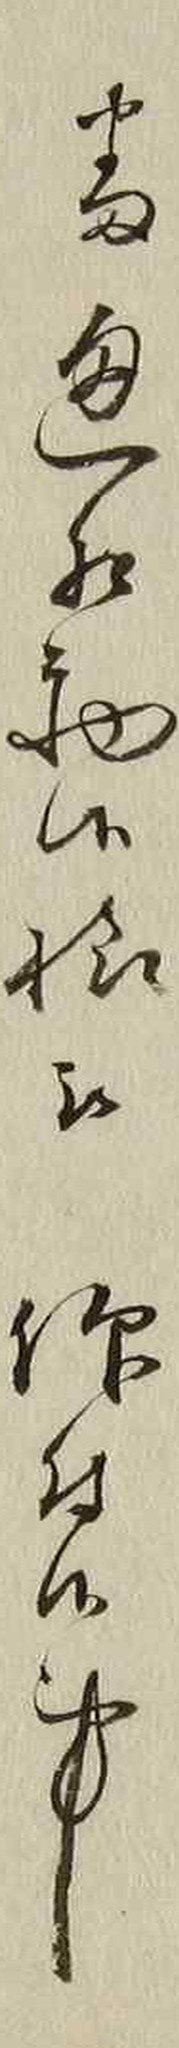番遍相勤候様被仰付候事
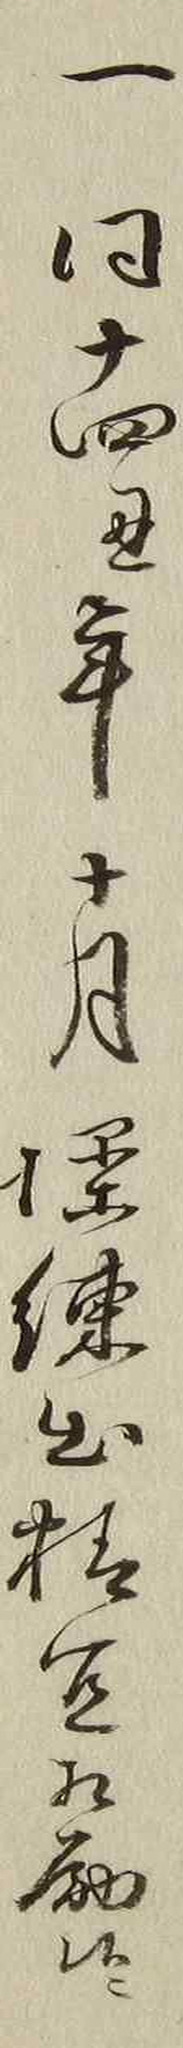一同十四丑年十月操練出精宜相励候ニ
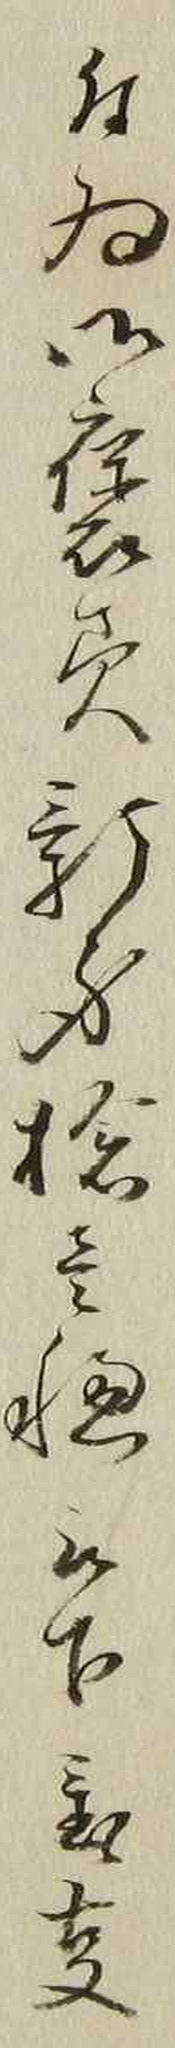付為御褒美新身槍壱穂被下置候事
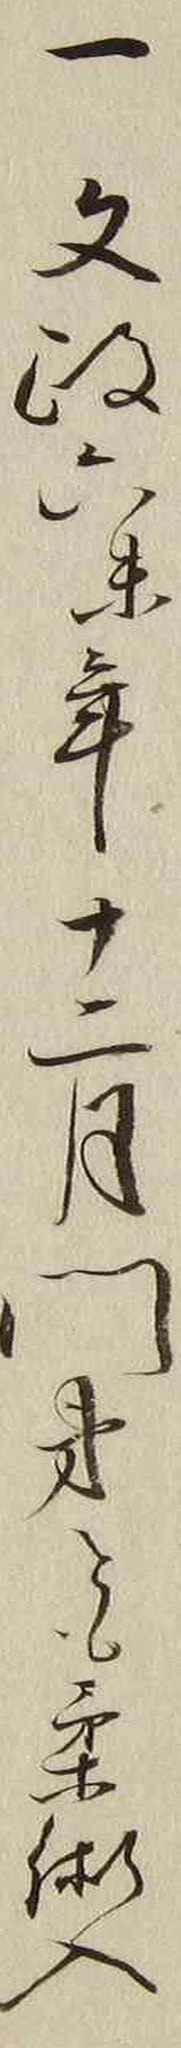一文政六未年十二月門弟とも柔術入
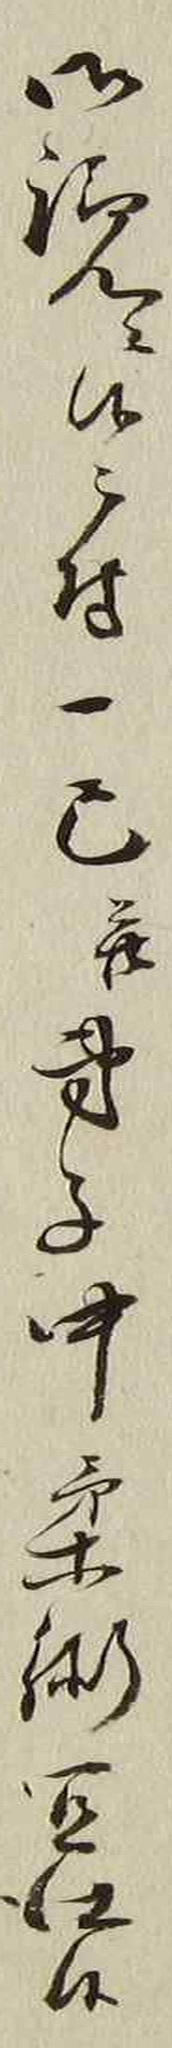御覧ニ候ニ付一己并弟子中柔術宜仕候
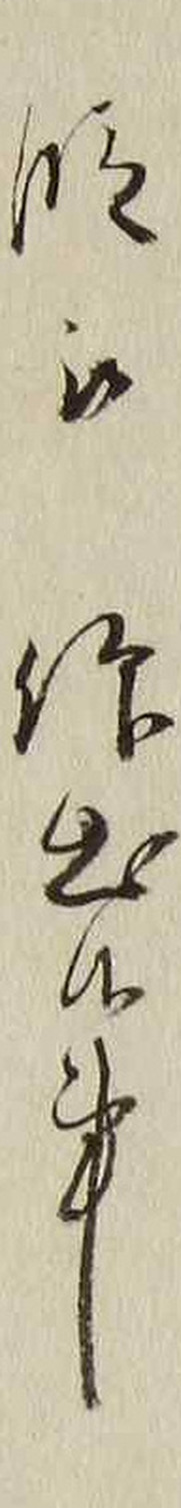段被仰出候事

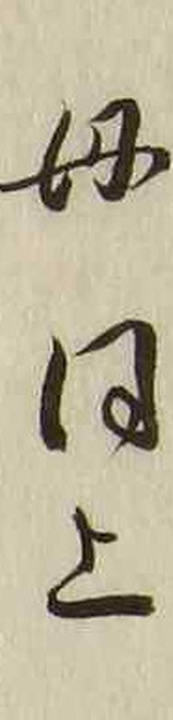母同上
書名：諸士系譜　巻之26　い之部26
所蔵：会津若松市立会津図書館
